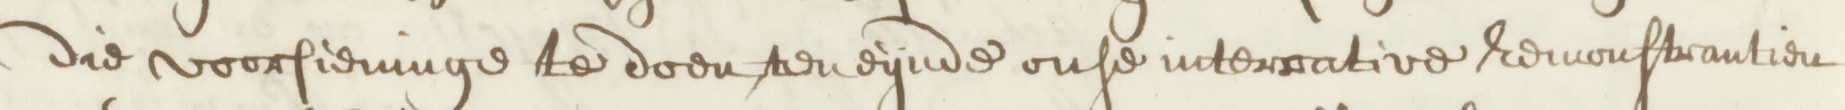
die voorsieninge te doen teneijnde onse interrative remonstrantien
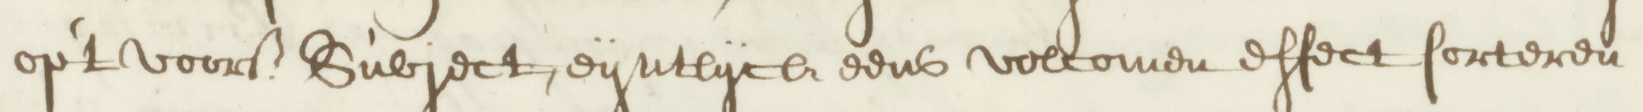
op't voors. Subject, eijntlijck eens volcomen effect sorteren. —
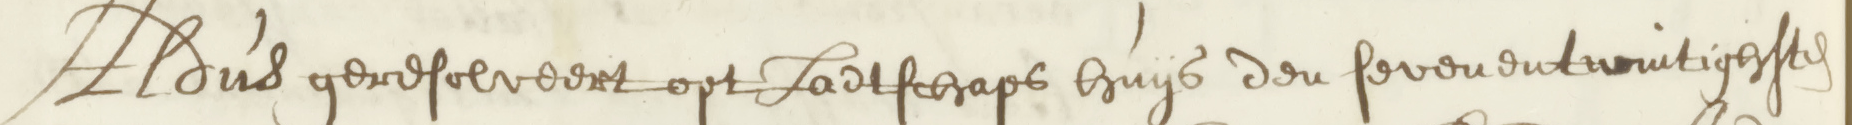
Adus geresolveert opt Ladtschaps huijs den sevenentwintighsten
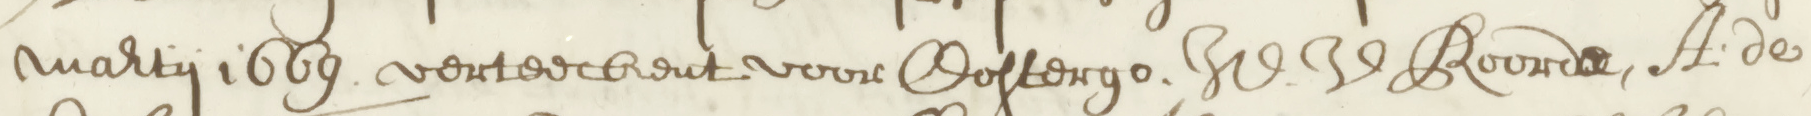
martij 1669 verteeckent voor Oostergo. W. V. Roorda, A: de
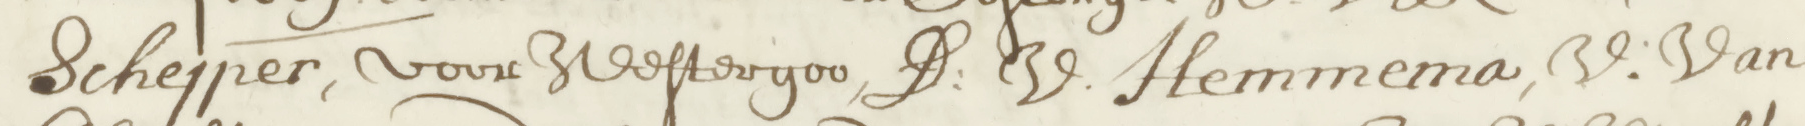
Schepper, voor Westergoo, D. V. Hemmema, V. Van
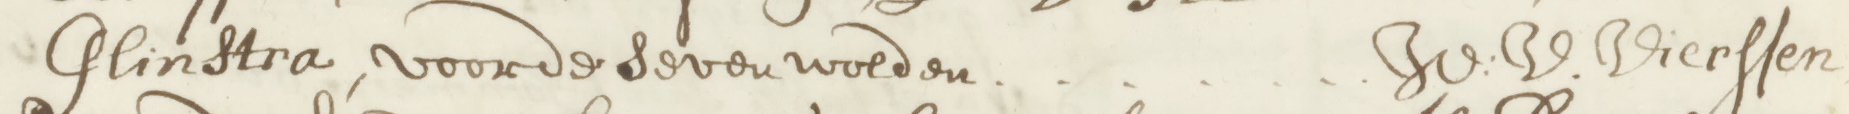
Glinstra, voor de Sevenwolden . . . . . . W. V. Vierssen
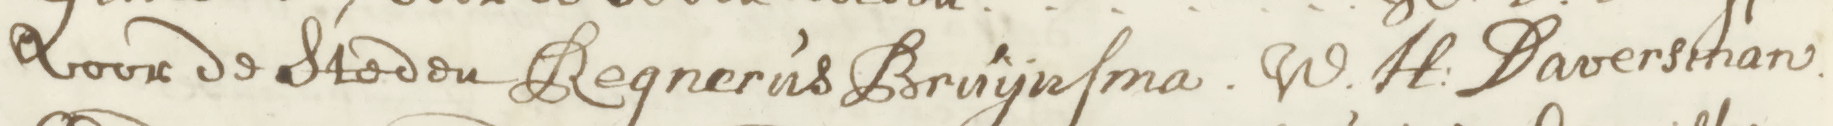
voor de Steden Regnerus Bruijnsma, W. H. Daversman
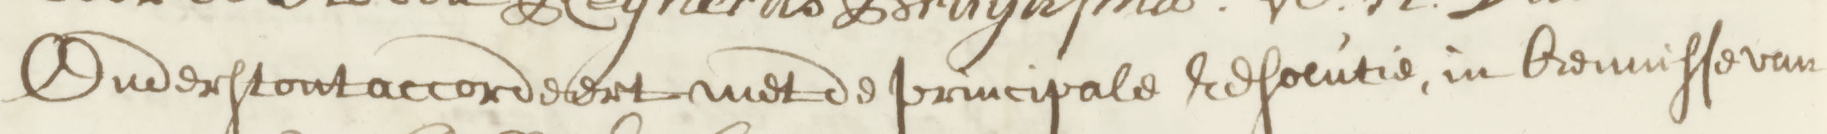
Onderstont accordeert met de principale resolutie, in kennisse van
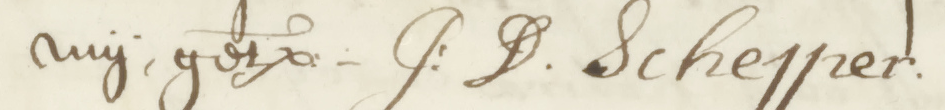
mij, getk: J: D. Schepper. —
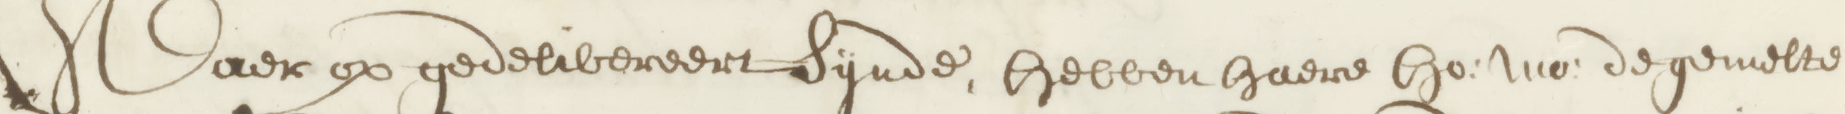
Waer op gedelibereert Sijnde, hebben haere Ho:Mo: de gemelte
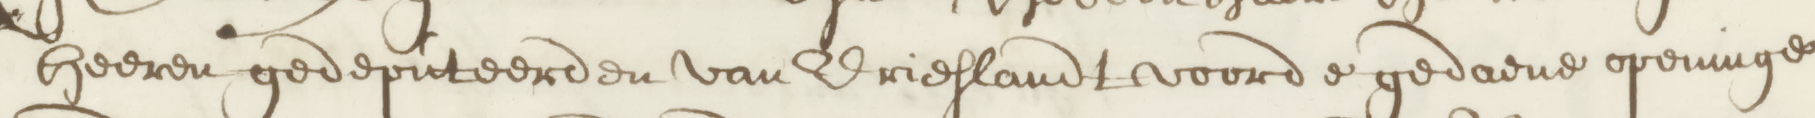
heeren gedeputeerden van Vrieslandt voorde gedaene openinge
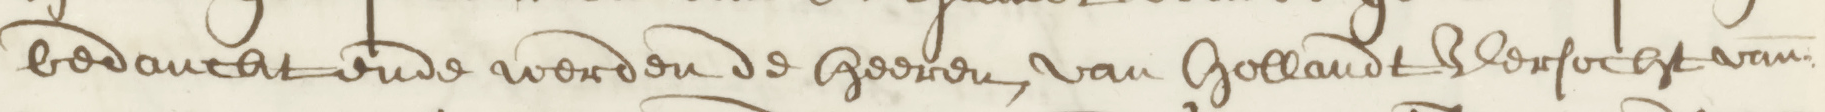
bedanckt ende werden de heeren van Hollandt Versocht van
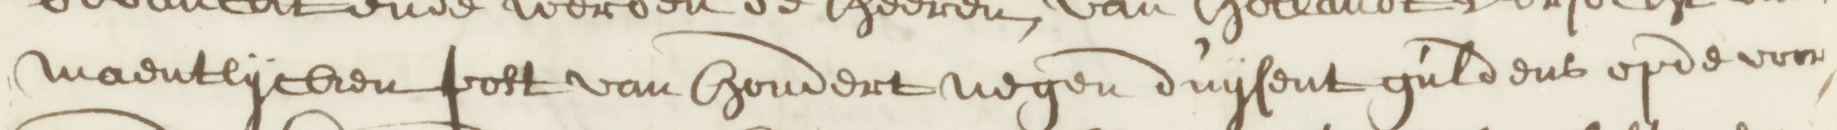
maentlijcken post van hondert negen duijsent guldens opde voor,
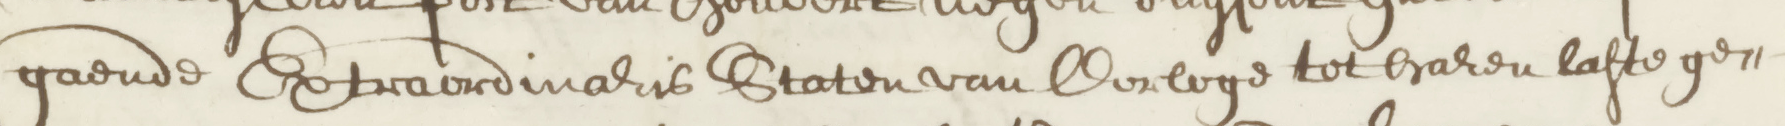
gaende Extraordinaris Staten van Oorloge tot haren laste ge„
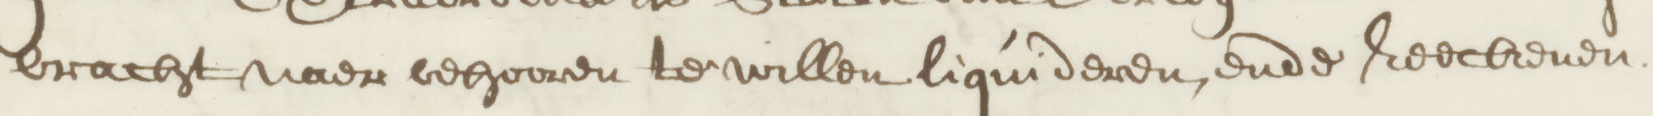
bracht naer behooren te willen liquideren, ende reeckenen.
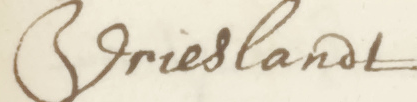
Vrieslandt
